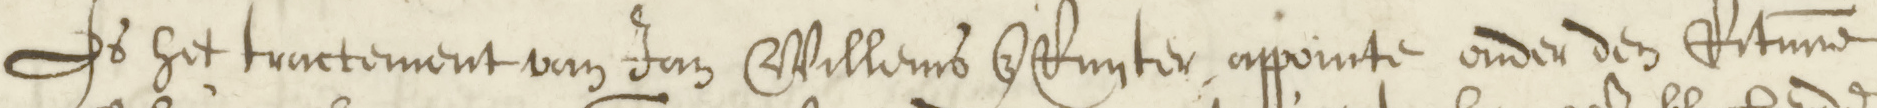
Is het tractement van Jan Willemsz Ruyter, appointe onder den Ritmre
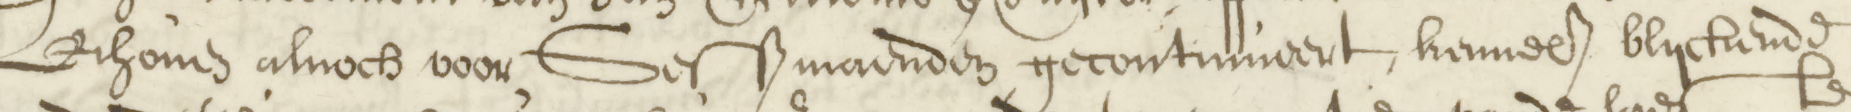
Rihouen alnoch voor Sess maenden gecontinueert, kennel blyckende
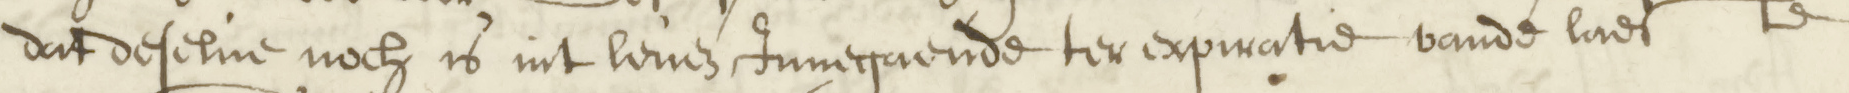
dat deselue noch is int leuen, Innegaende ter expiratie vande laeste
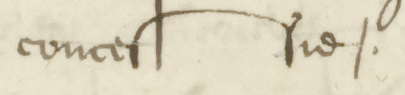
concessie.
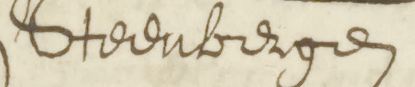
Steenbergen
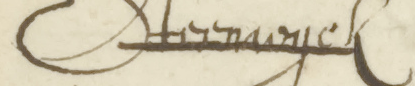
Steenwyck
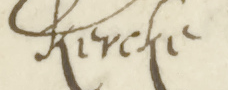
kercke
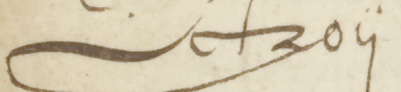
Octroij
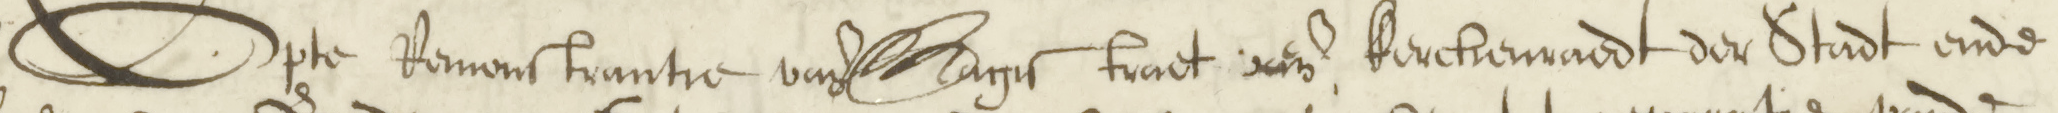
Opte Remonstrantie van Magistraet aen kerckenraedt der Stadt ende
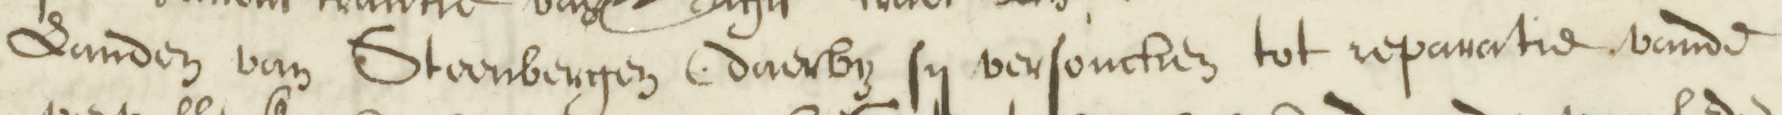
Landen van Steenbergen (.daerby sij versoucken tot reparatie vande
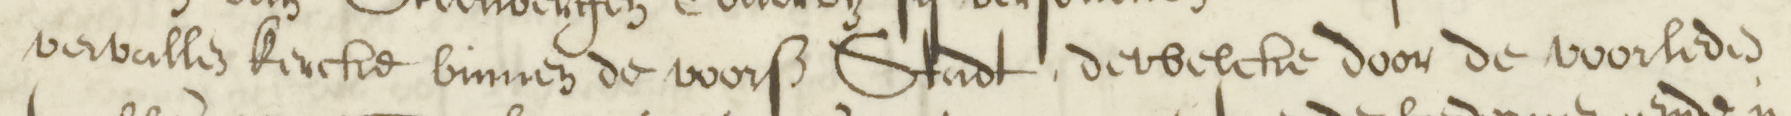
vervallen kercke binnen de voors Stadt, dewelcke door de voorleden
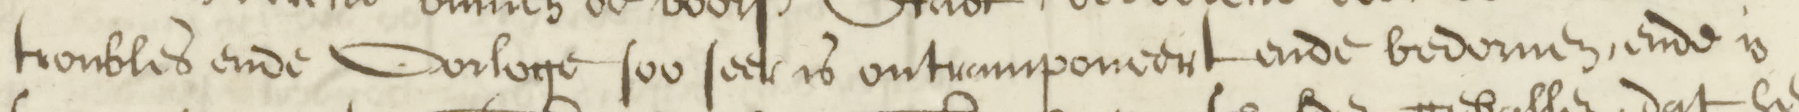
troubles ende Oorloge soo seer is ontramponeert ende bedoruen, ende in
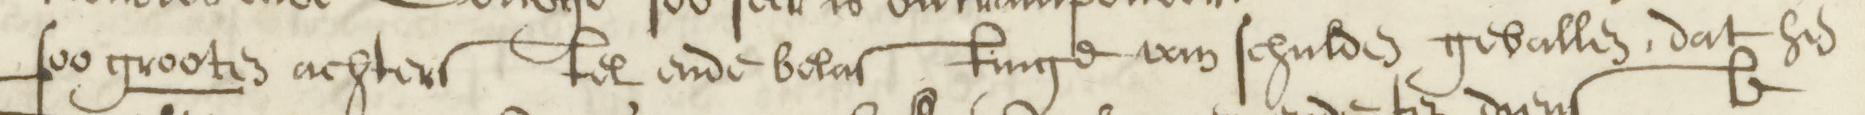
soo grooten achterstel ende belastinge van schulden gevallen, dat hen
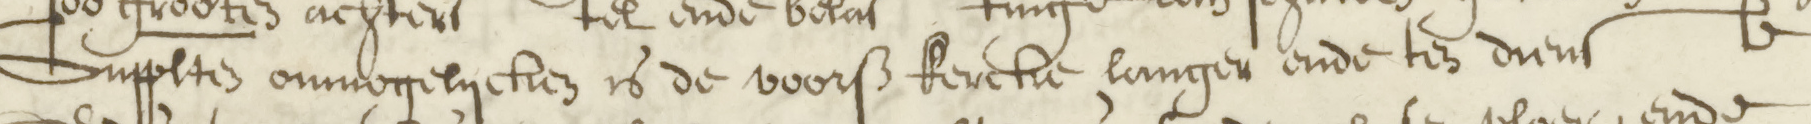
Supplten onmogelycken is de voors kercke langer ende ten dienste
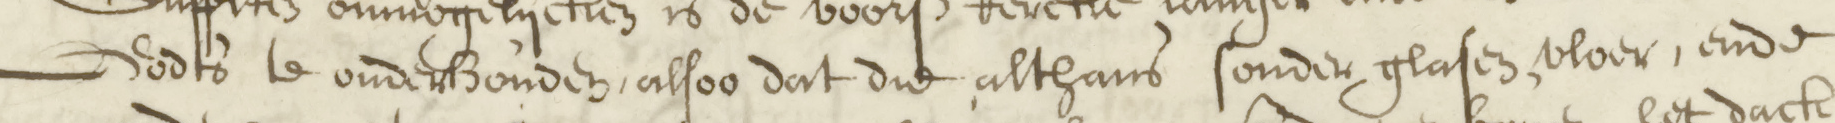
Godts te onderhouden, alsoo dat die althans sonder glasen, vloer, ende
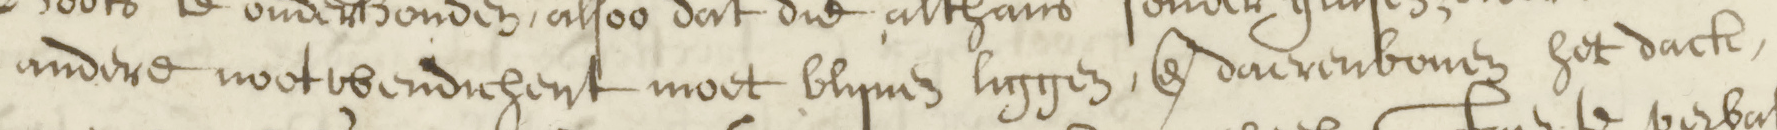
andere nootwendicheyt moet blyuen liggen, & daerenbouen het dack,
